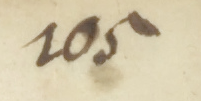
105
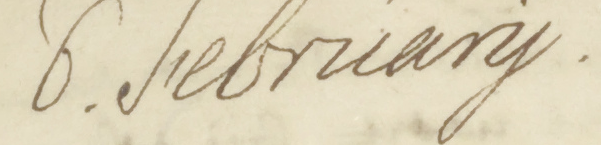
6. Februarij.
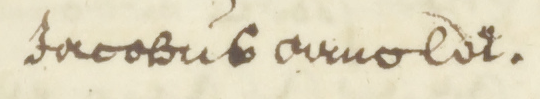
Jacobus Arnoldi.
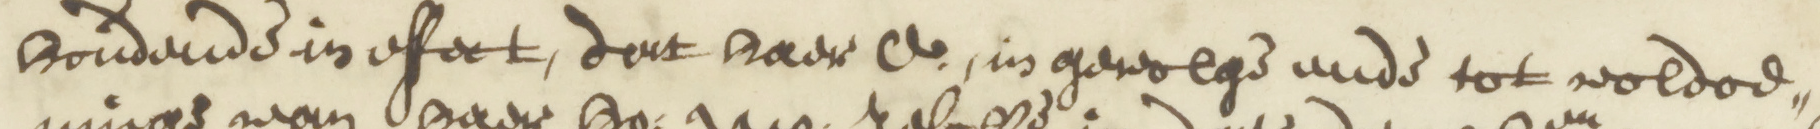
houdende in effect, dat haer E., in gevolge ende tot voldoe„
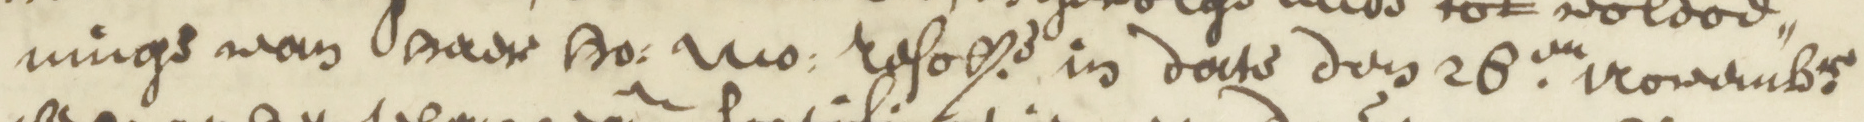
ninge van haer Ho:Mo: resole. in date den 26en. Novembr.
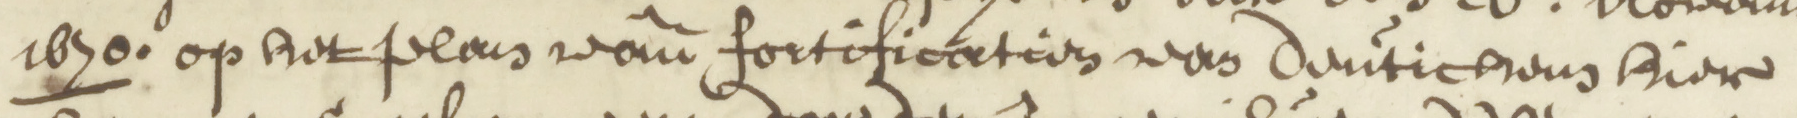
1670. op het plan van fortificatien van Deutichem hier
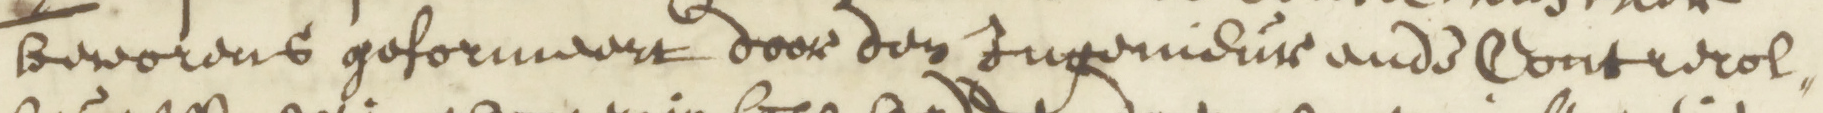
bevorens geformeert door den Ingenieur ende Contrerol„
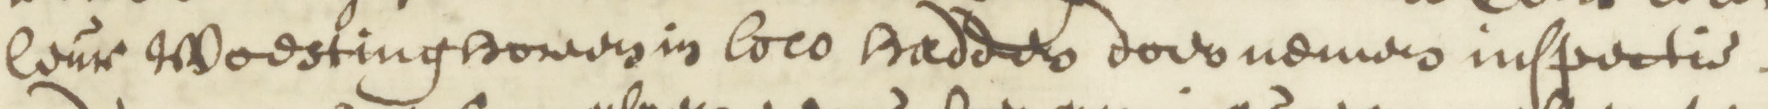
leur Woestinghoven in loco hadden doen nemen inspectie —
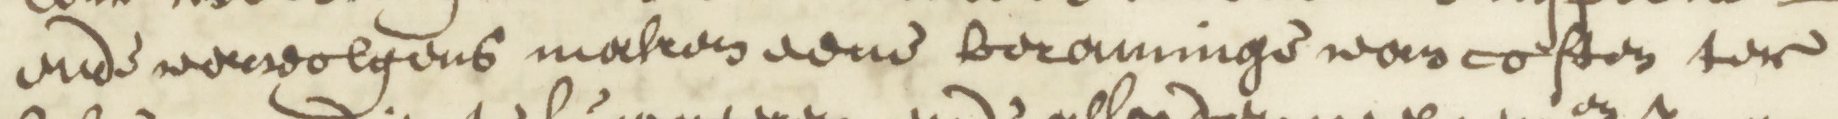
ende vervolgens maken eene beraminge van costen ter
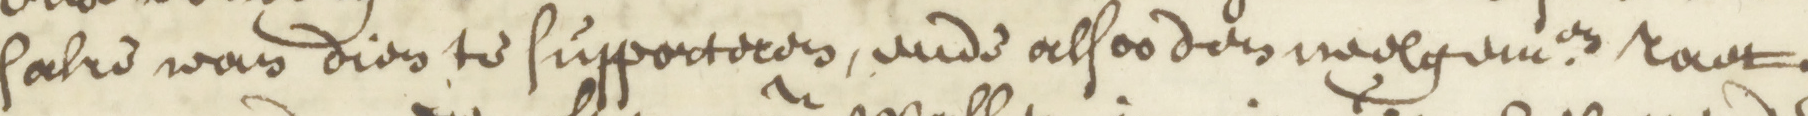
sake van dien te supporteren, ende alsoo den welgemen. Raet
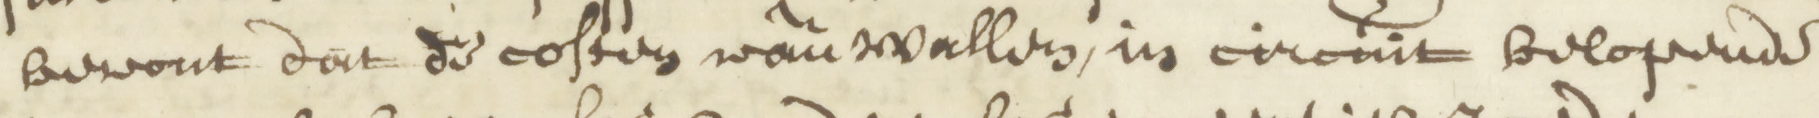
bevont dat de costen van Wallen, in circuit belopende
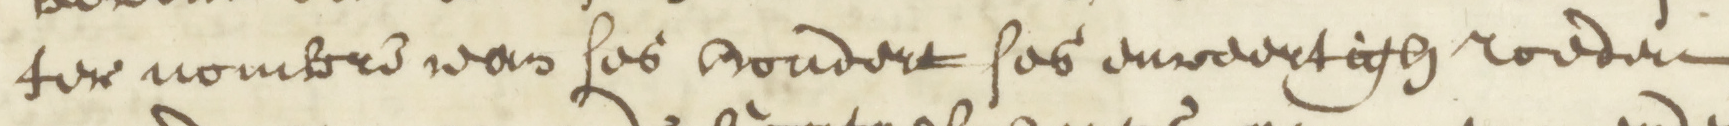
ter nombre van ses hondert ses enveertigh roeden
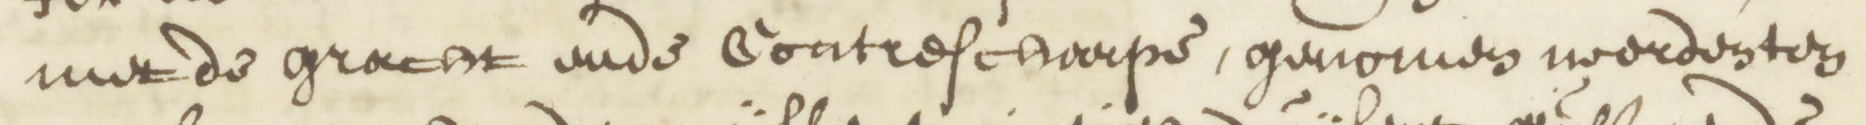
met de gracht ende Contrescharpe, genomen worden ten
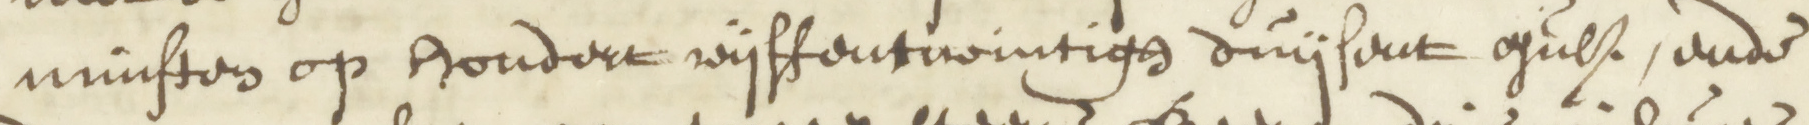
minsten op hondert vijffentwintigh duijsent gul., ende
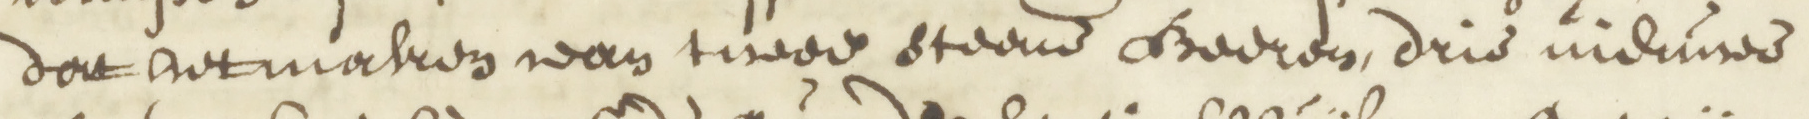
dat het maken van twee steene Beeren, drie nieuwe
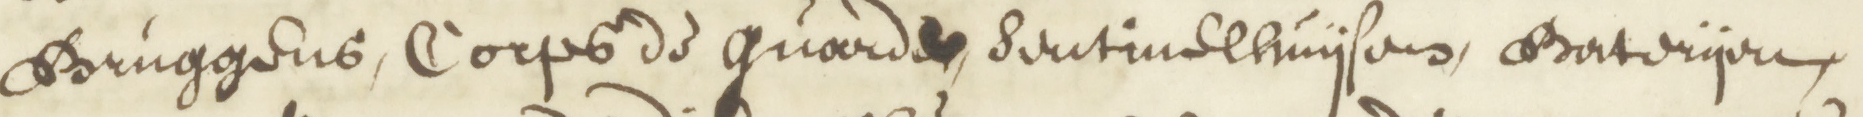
Bruggens, Corps de Guarden, sentinelhuijsen, Baterijen,
